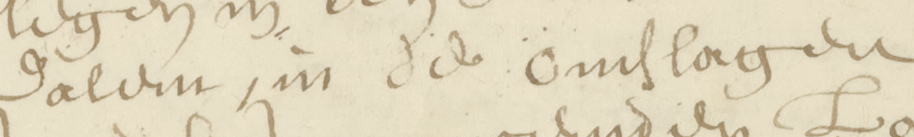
dalem, in de omslagen
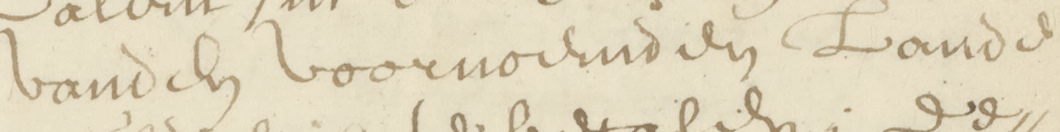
vanden voornoemden Lande
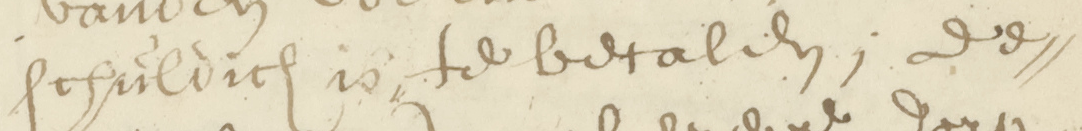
schuldich is te betalen; de,,
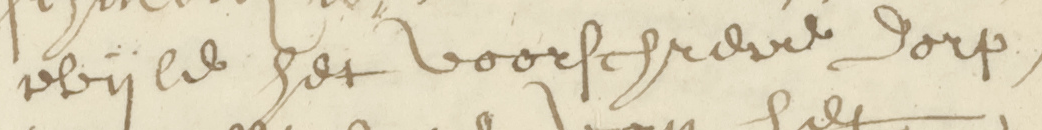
wijle het voorschreve dorp
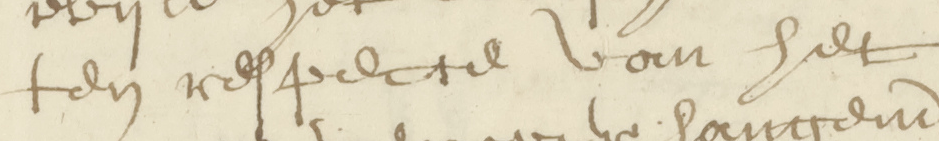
ten respecte van het
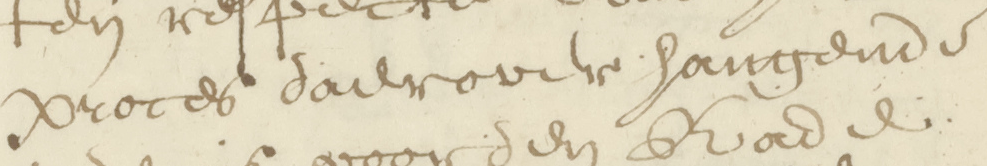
proces daerover hangende
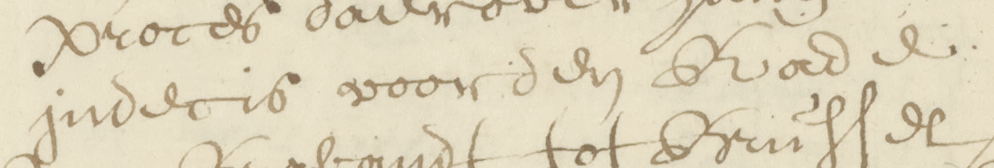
indecis voor den Rade
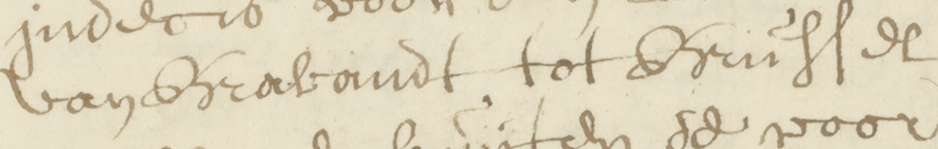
van Brabandt tot Brussel
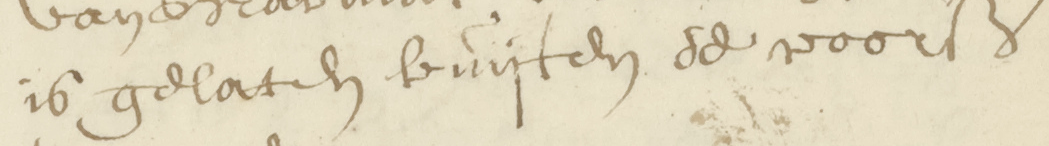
is gelaten buijten de voors
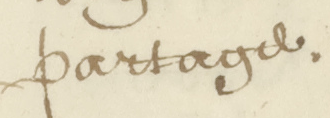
partage.
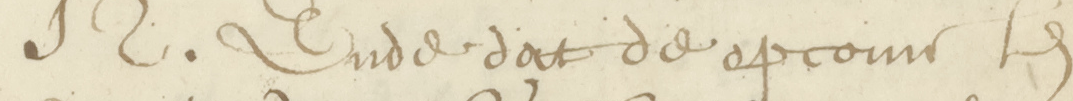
12. Ende dat de opcomste
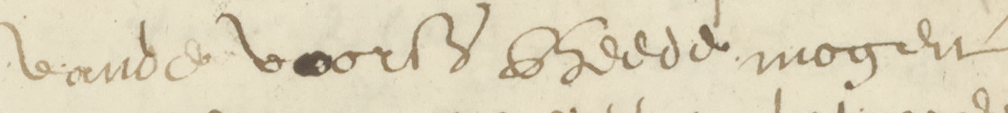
vande voors Beede mogen
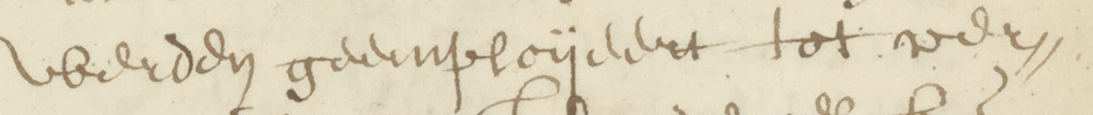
werden geemploijeert tot ver,,
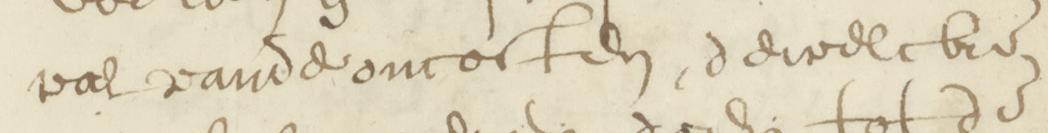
val vande oncosten, dewelcke
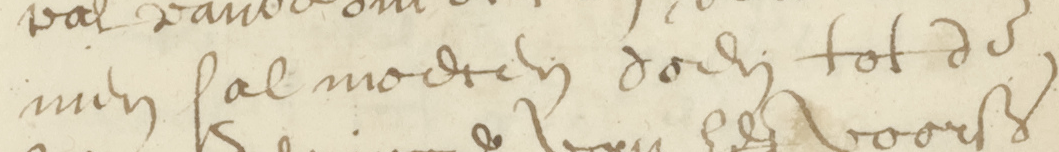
men sal moeten doen tot de
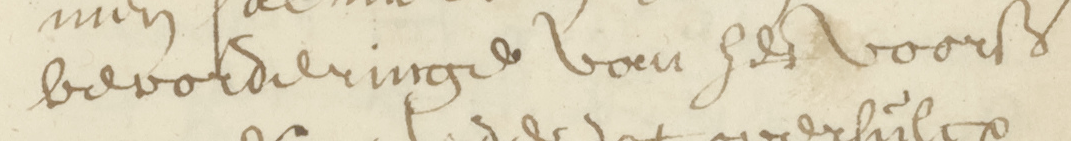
bevorderinge van het voors
